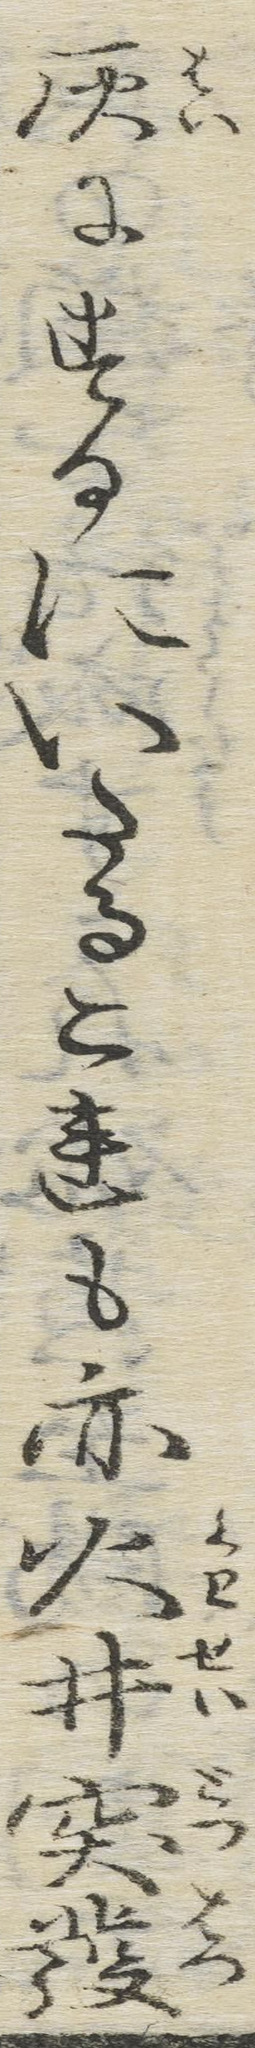灰にするにいたるきも亦火井突発
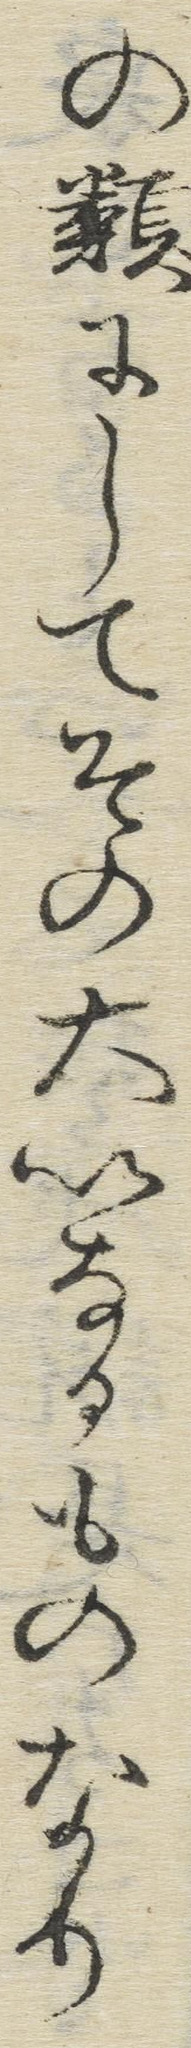の類にしてその大いなるものなり
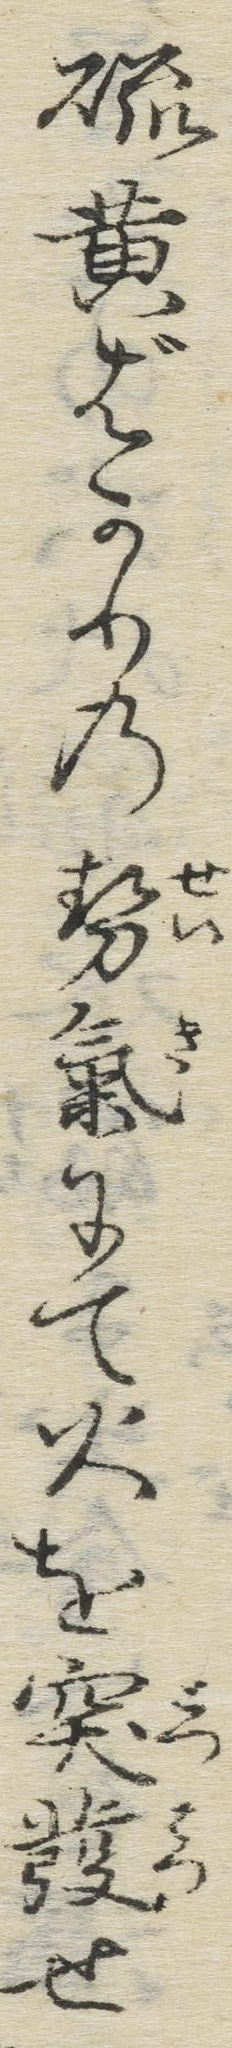硫黄ばかりの勢気にて火を突発せ
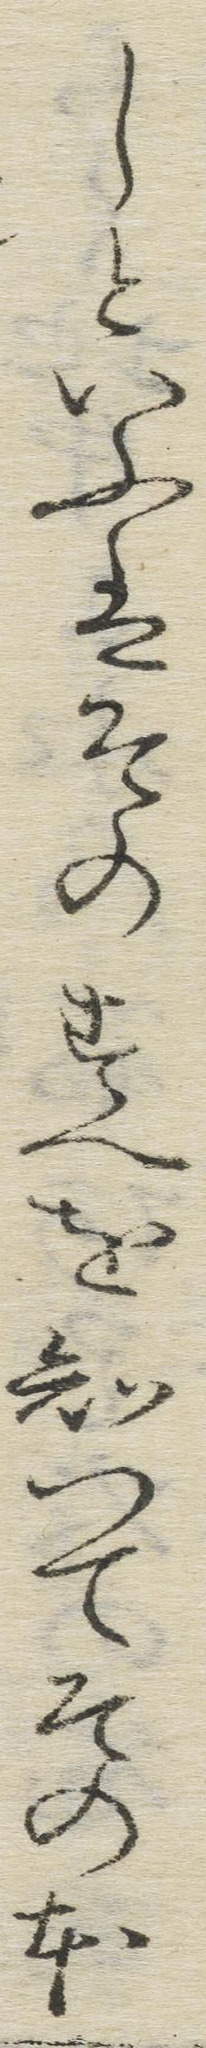しといふはそのすへを知つてその本
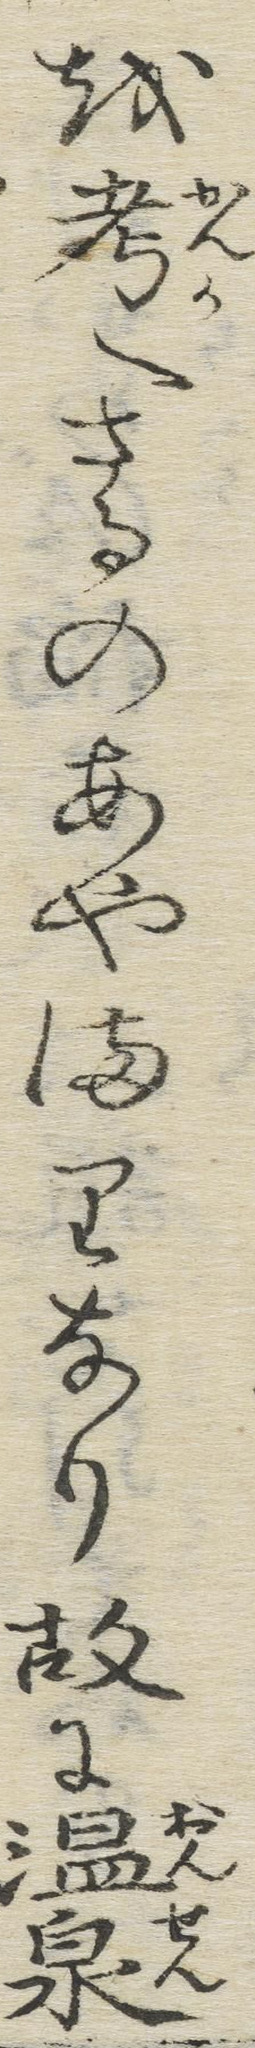を考へさるのあやまりなり故に温泉
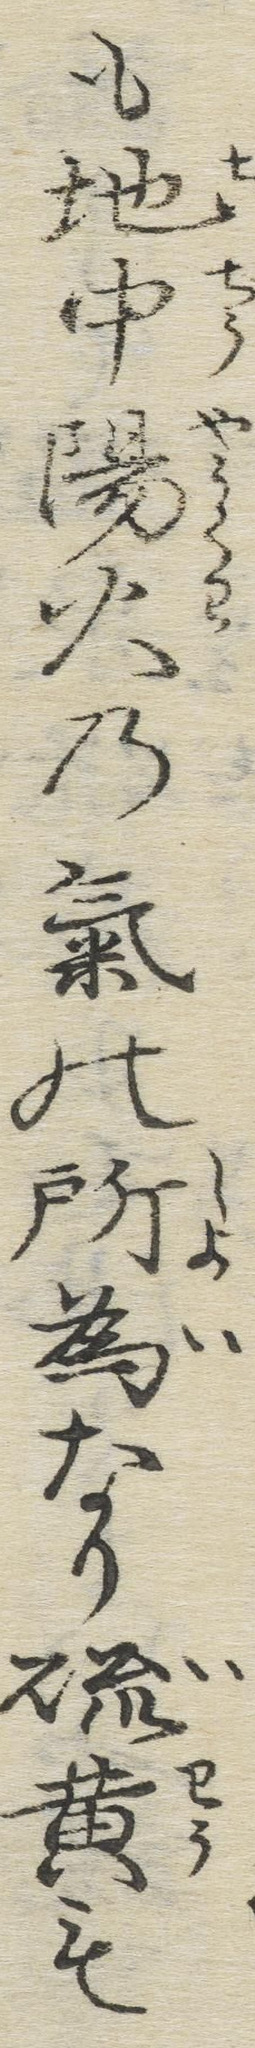も地中陽火の気の所為なり硫黄も
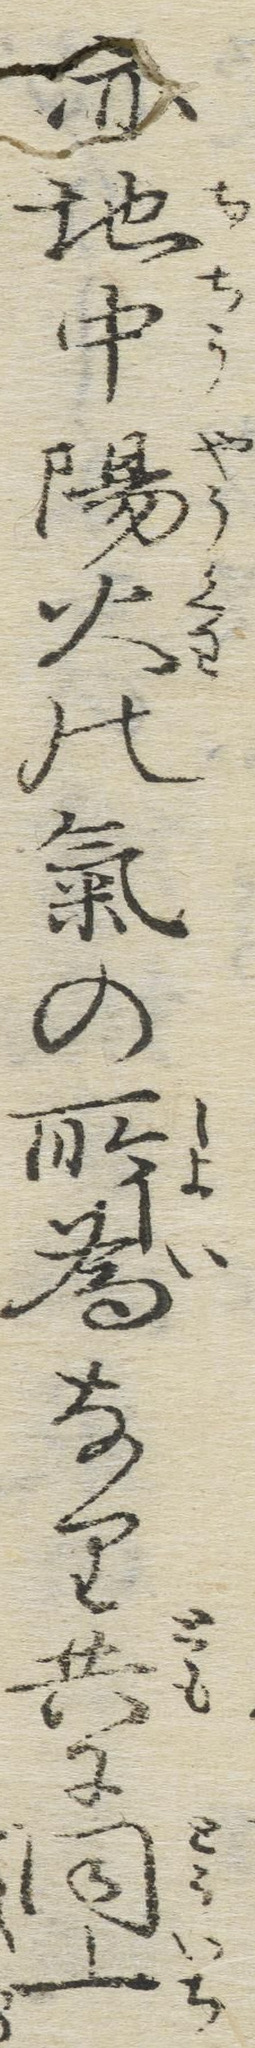亦地中陽火の気の所為なり共に同一
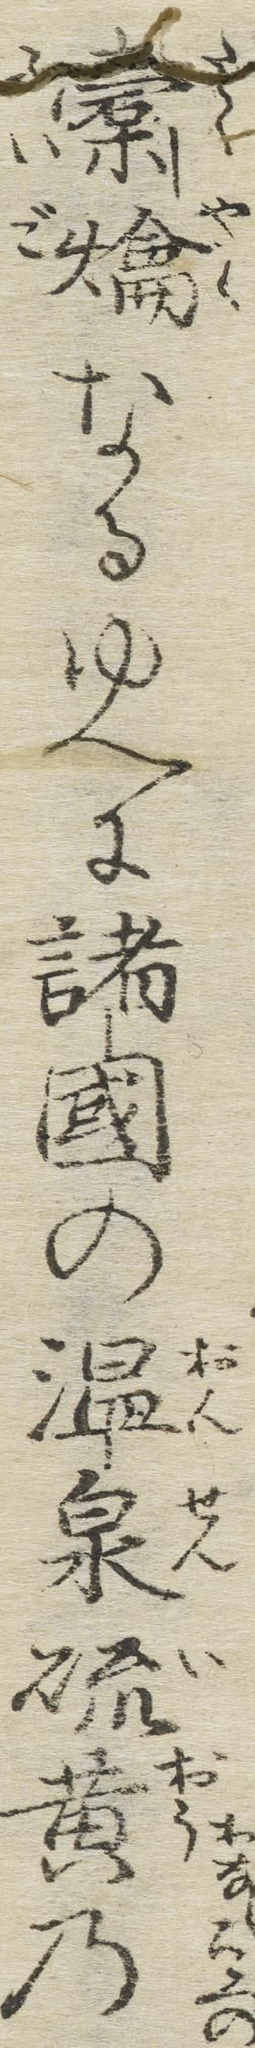橐爚なるゆへに諸国の温泉硫黄の
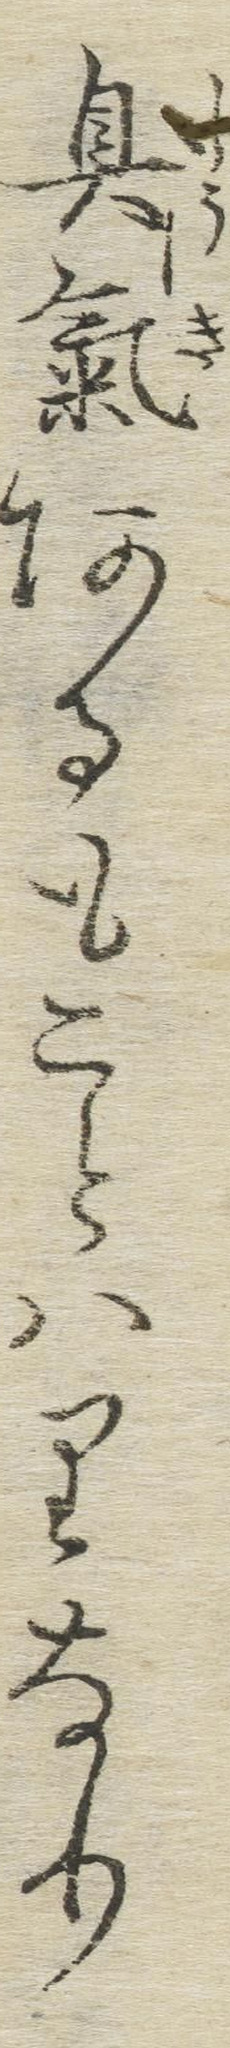臭気なるもことはりなり

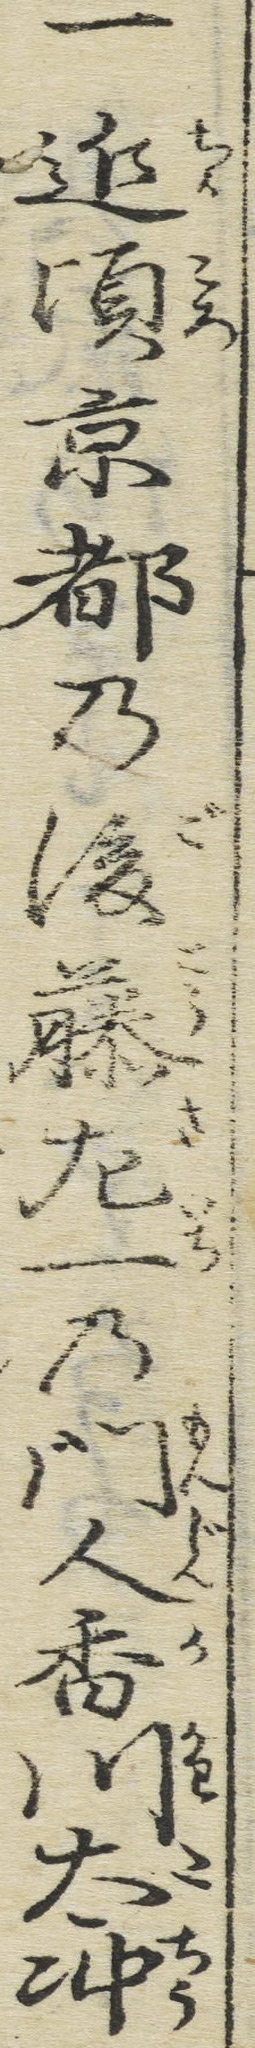一近頃京都の後藤左一の門人香川太冲
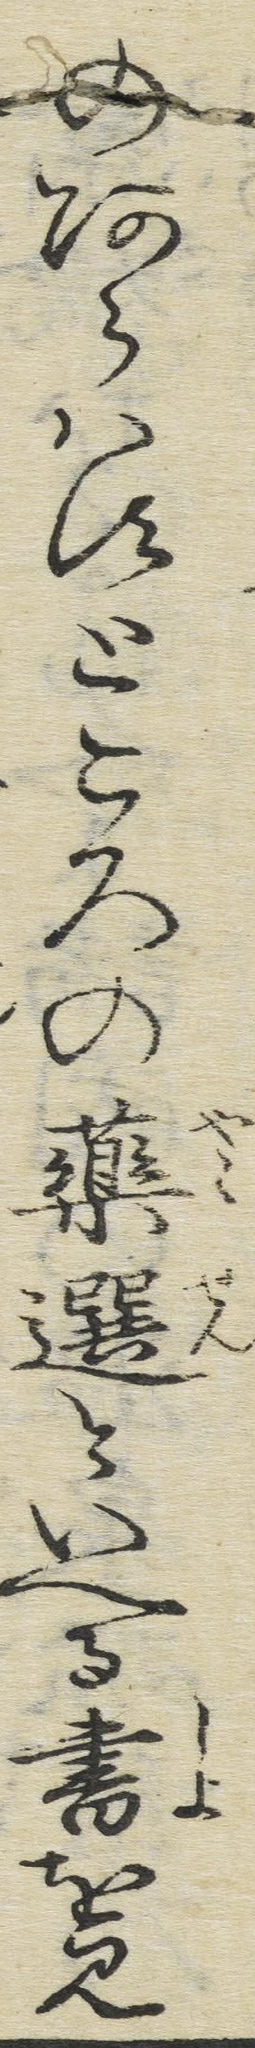のあらはすところの薬選といへる書を見
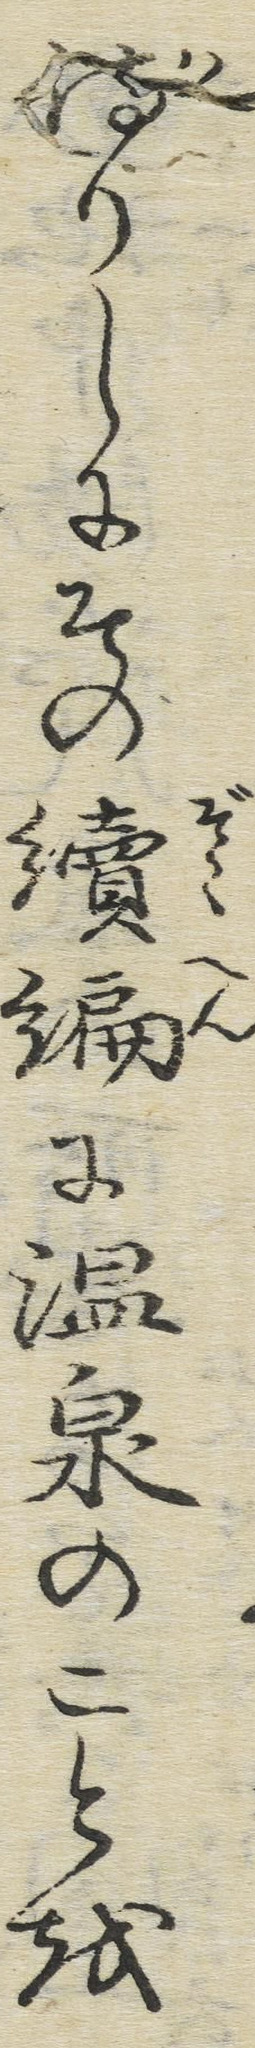侍りしにその続編に温泉のことを
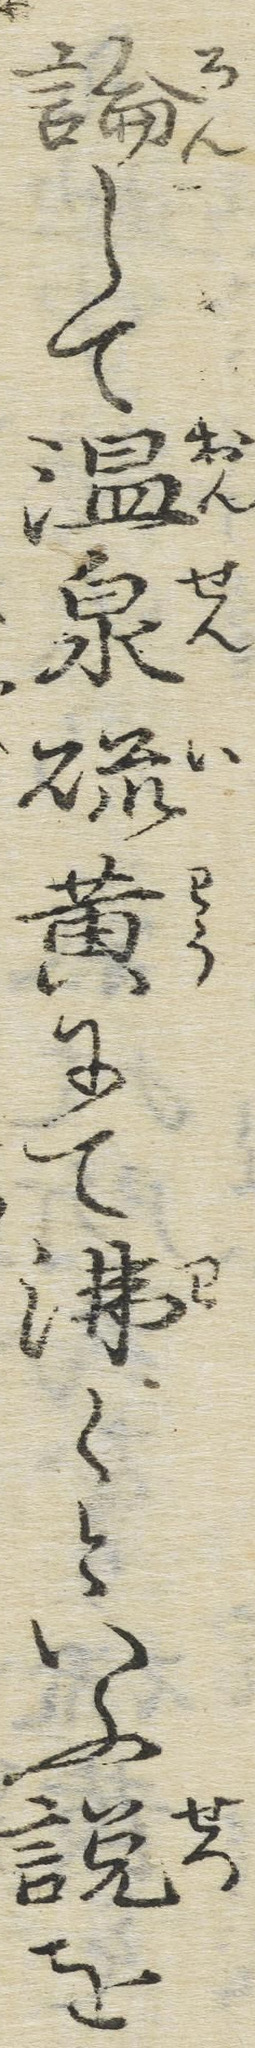論して温泉硫黄にて沸くといふ説を
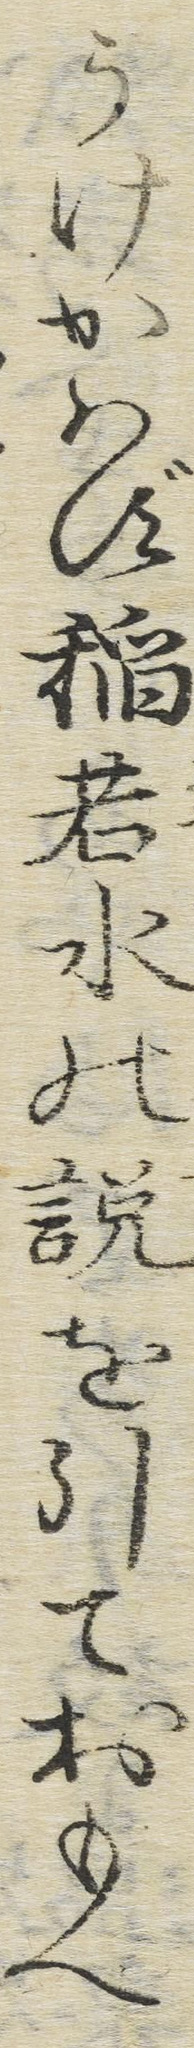うけかはず稲若水の説を引ておもへ
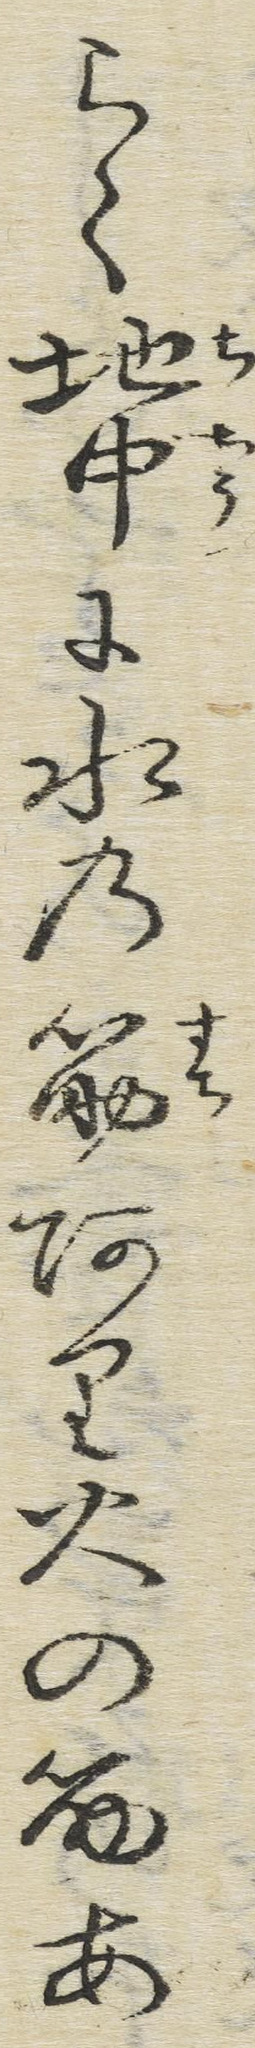らく地中に水の筋あり火の筋あ
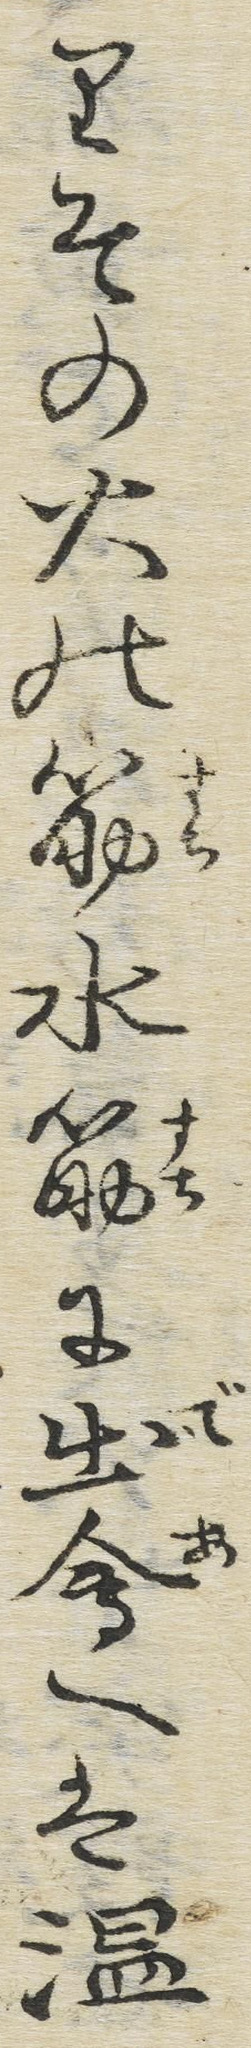りその火の筋水筋に出会へは温
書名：温泉考
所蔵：東京大学地震研究所図書室 Earthquake Research Institute Library, The University of Tokyo, JAPAN
